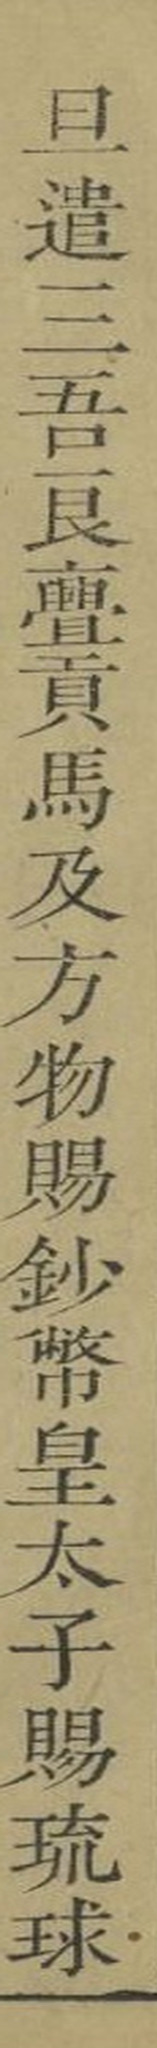旦遣三吾良亹貢馬及方物賜鈔幣皇太子賜琉球
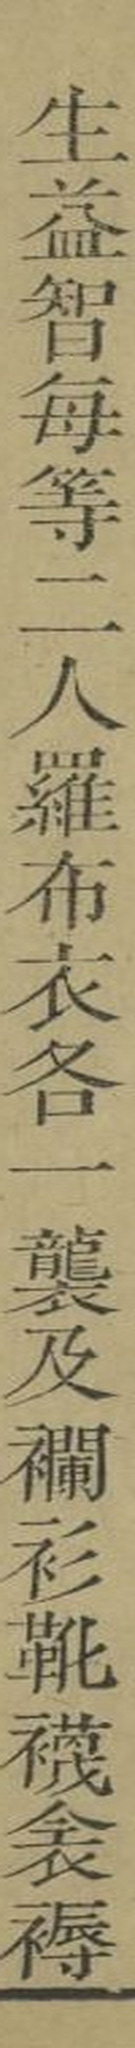生益智毎等二人羅布衣各一襲及襴衫靴襪衾褥
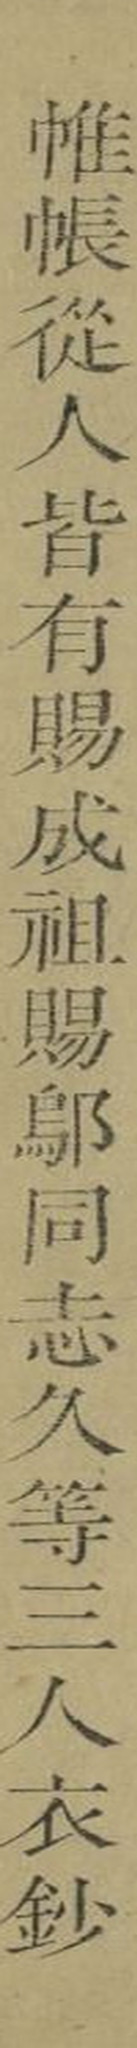帷帳従人皆有賜成祖賜鄔同志久等三人衣鈔
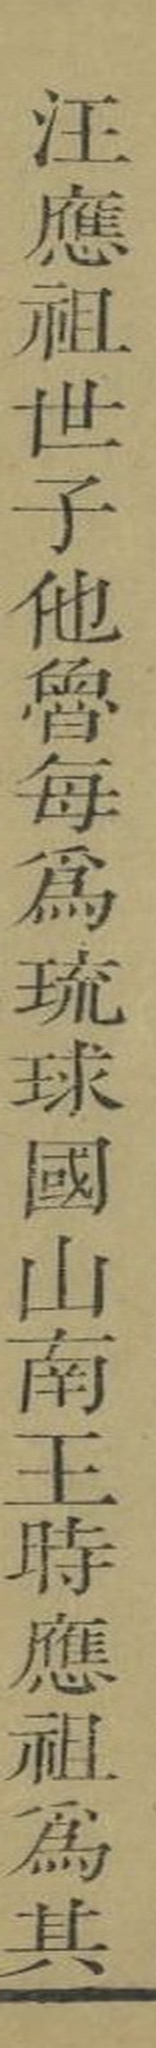汪応祖世子他魯毎為琉球国山南王時応祖為其
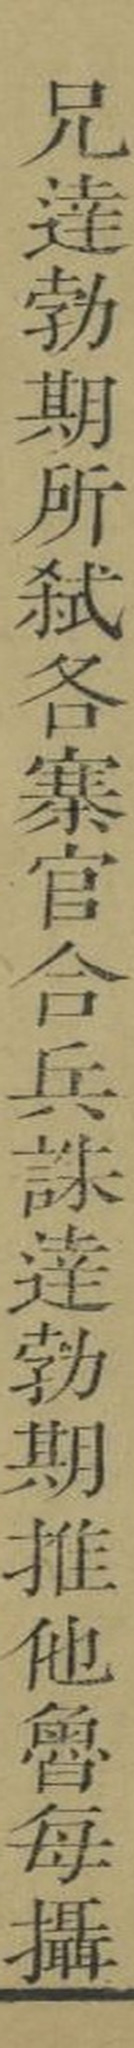兄達勃期所弑各寨官合兵誅達勃期推他魯毎摂
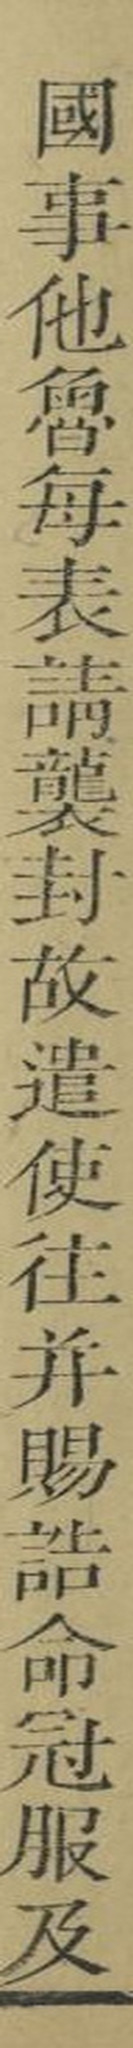国事他魯毎表請襲封故遣使往并賜誥命冠服及
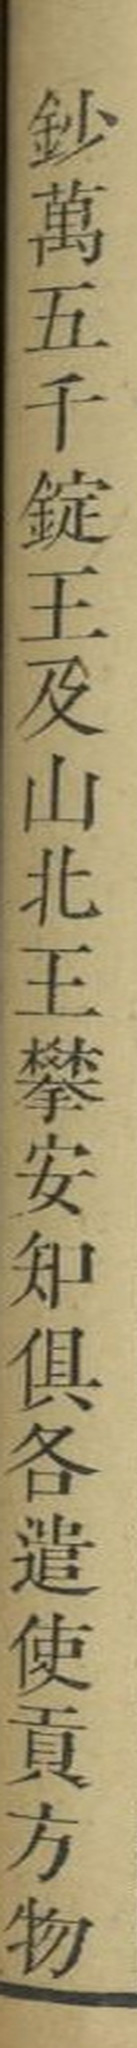鈔万五千錠王及山北王攀安知俱各遣使貢方物
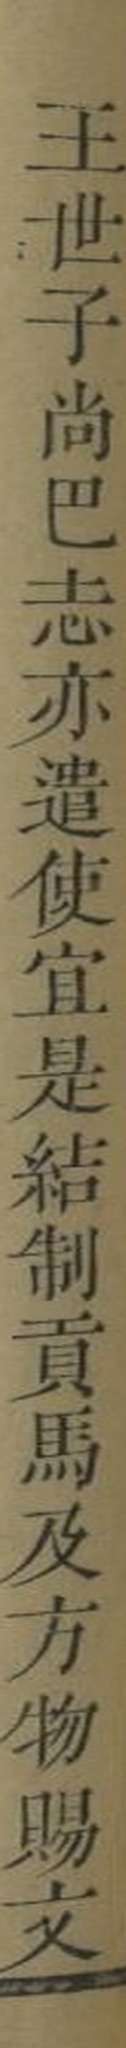王世子尚巴志亦遣使宜是結制貢馬及方物賜文
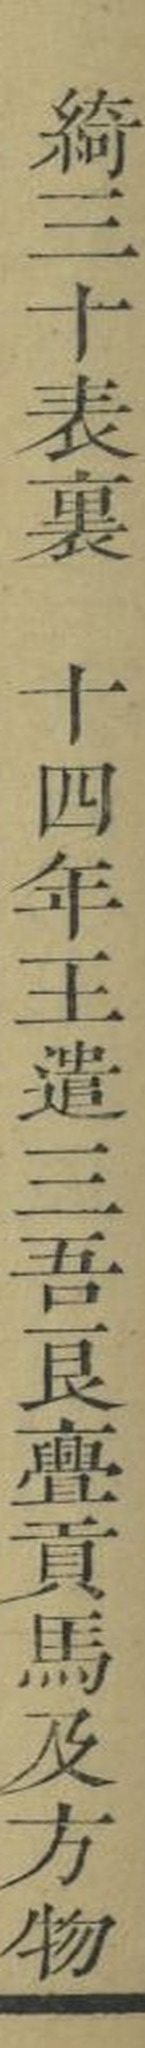綺三十表裏十四年王遣三吾良亹貢馬及方物
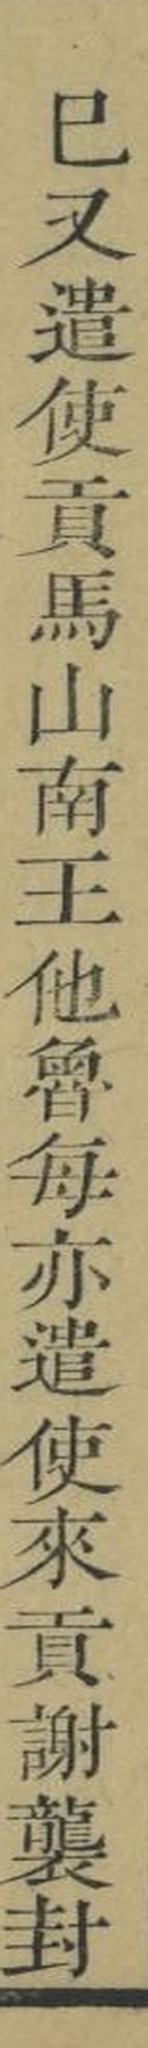巳又遣使貢馬山南王他魯毎亦遣使来貢謝襲封
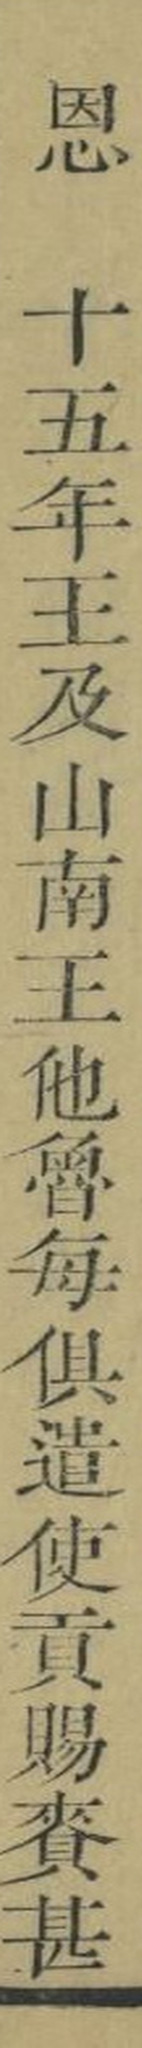恩十五年王及山南王他魯毎俱遣使貢賜賚甚
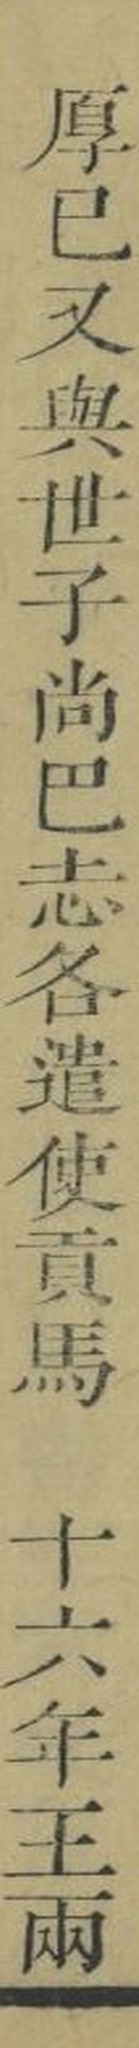厚巳又与世子尚巴志各遣使貢馬十六年王両
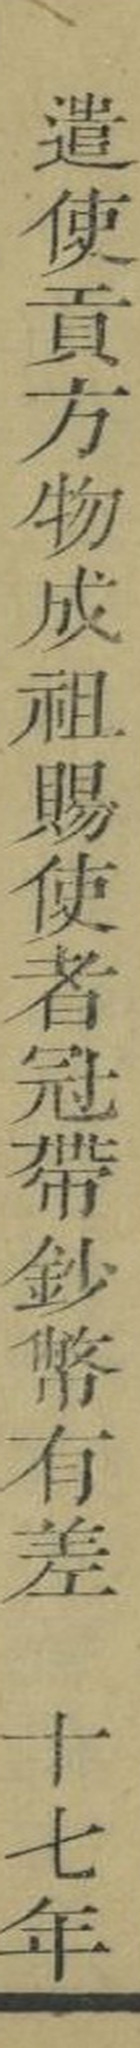遣使貢方物成祖賜使者冠帯鈔幣有差十七年
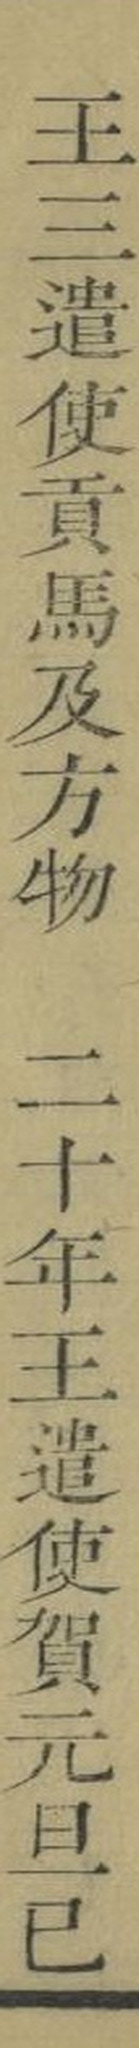王三遣使貢馬及方物二十年王遣使賀元旦巳
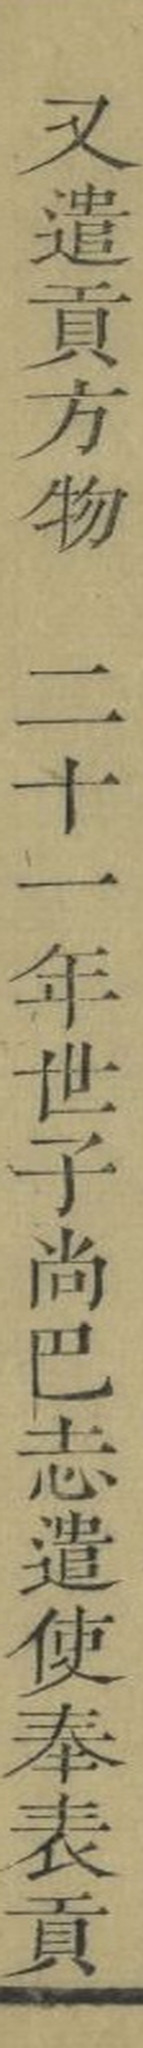又遣貢方物二十一年世子尚巴志遣使奉表貢
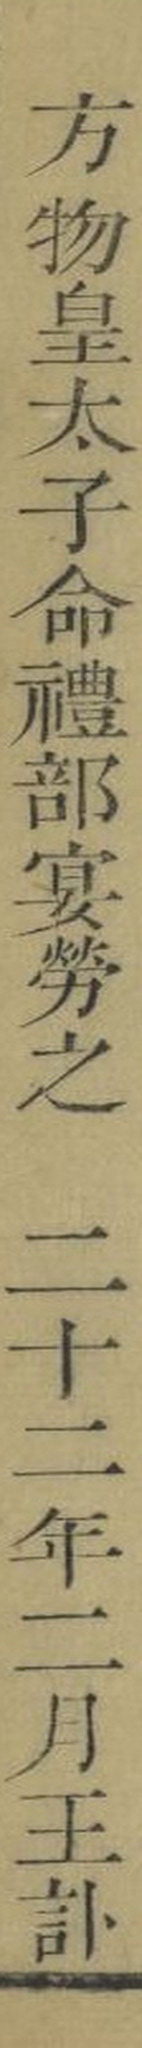方物皇太子命礼部宴労之二十二年二月王訃
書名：中山伝信録 巻三
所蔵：University of the Ryukyus Library
